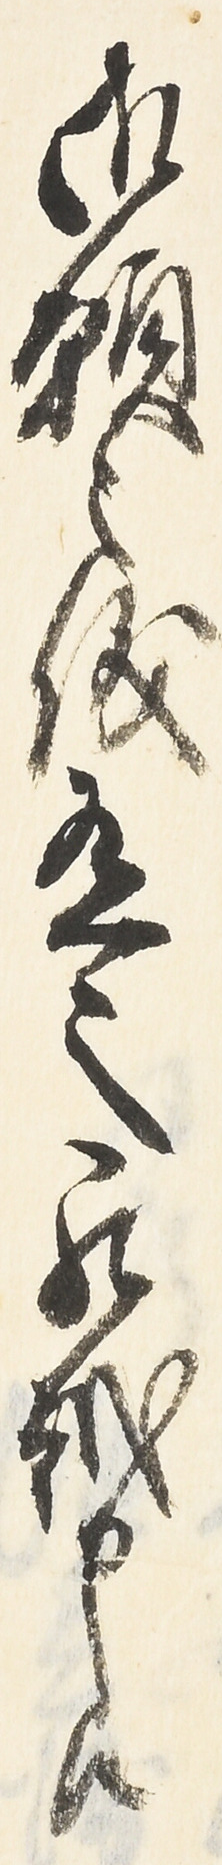御願之儀有之罷越申候
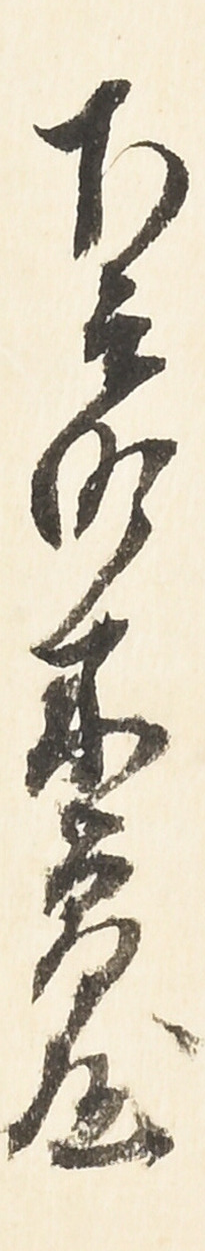下モ町木曽屋
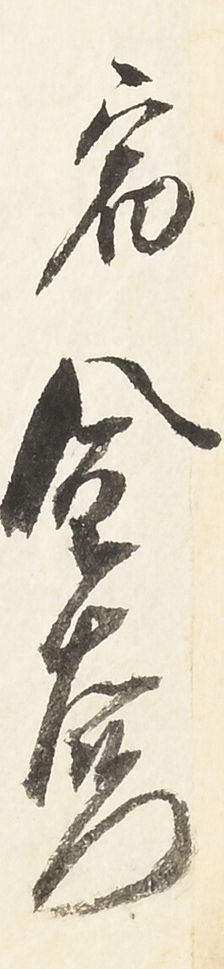宿金右衛門
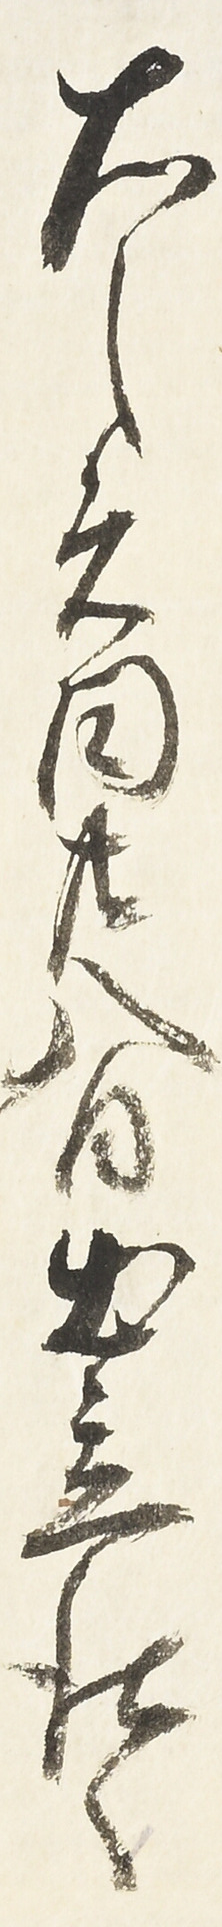右之者同廿八日出立仕候
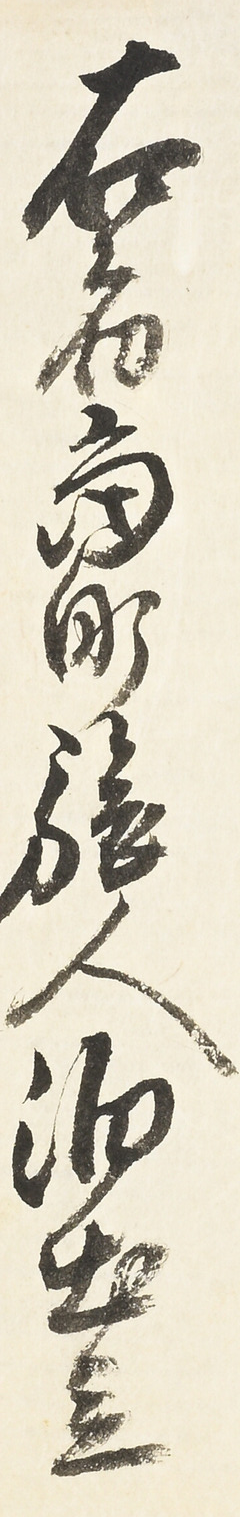右者当町旅人泊出立
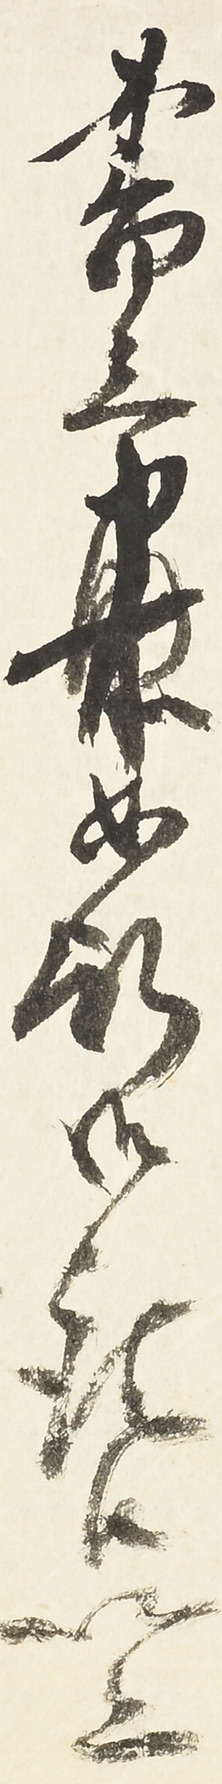書上申候所如斯御座候以上
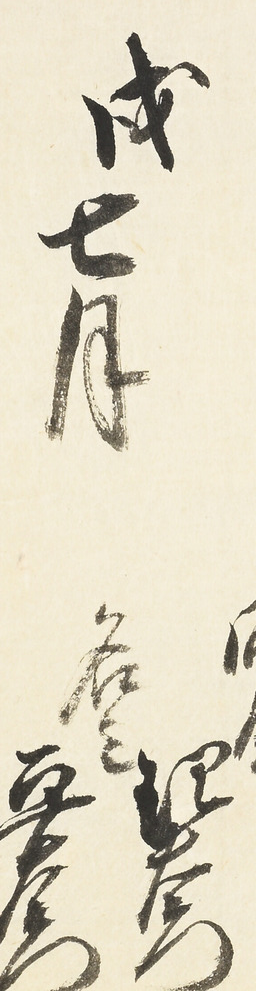戌七月理右衛門
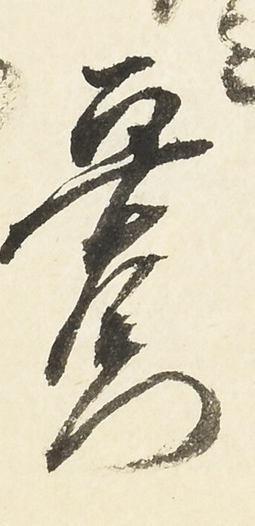平右衛門
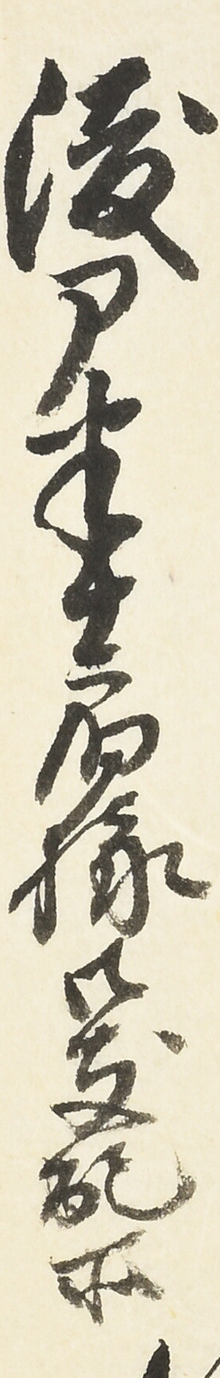渡部半十郎様御支配所
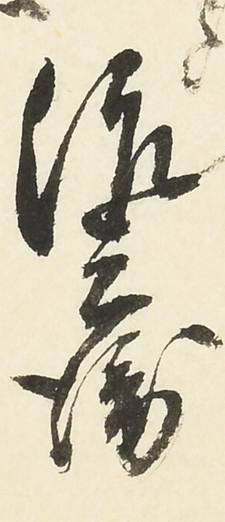治兵衛
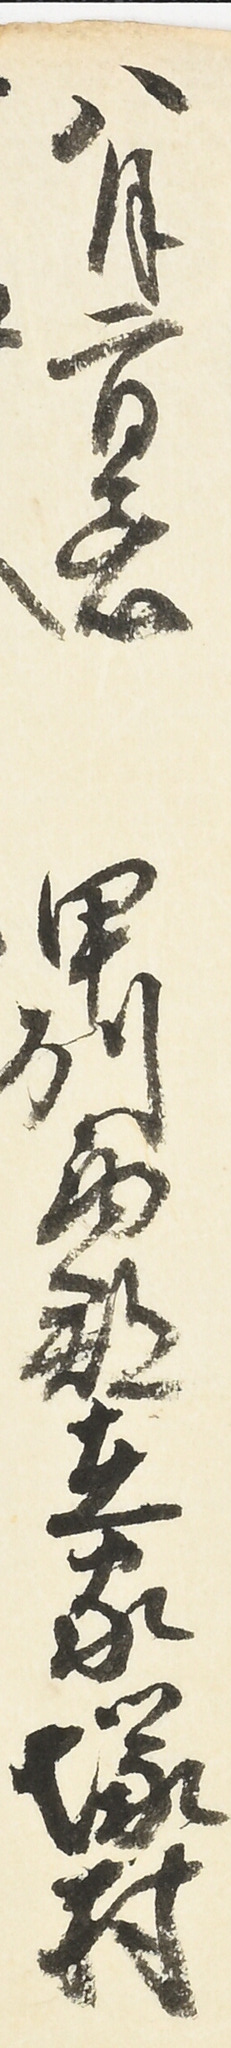八月二日着甲州西郡在家塚村
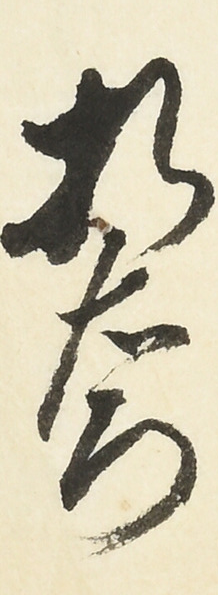平右衛門
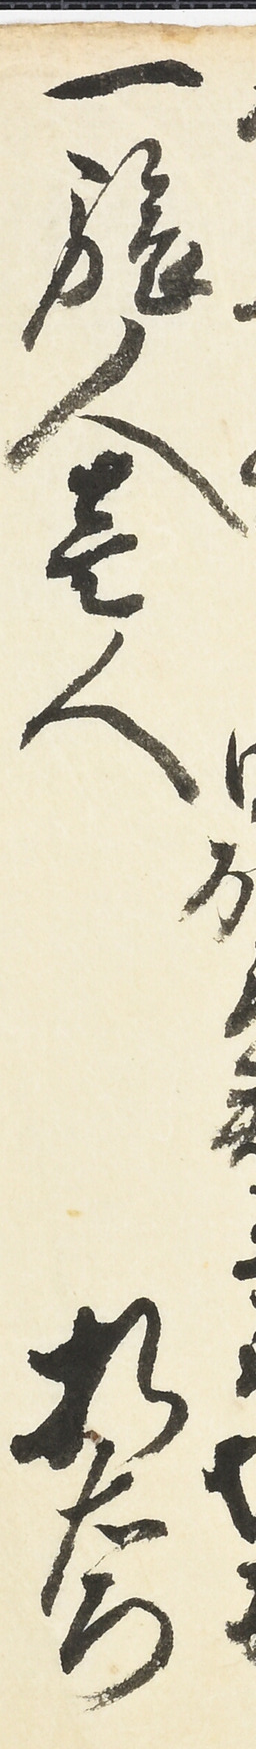一旅人壱人松右衛門
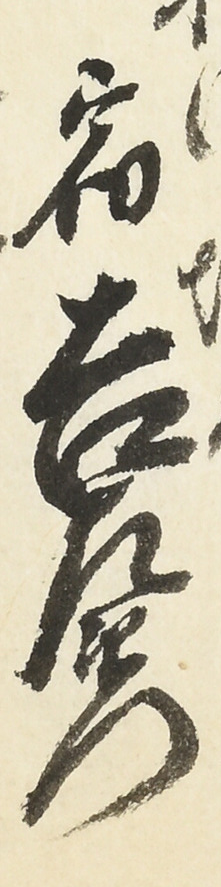宿吉左衛門
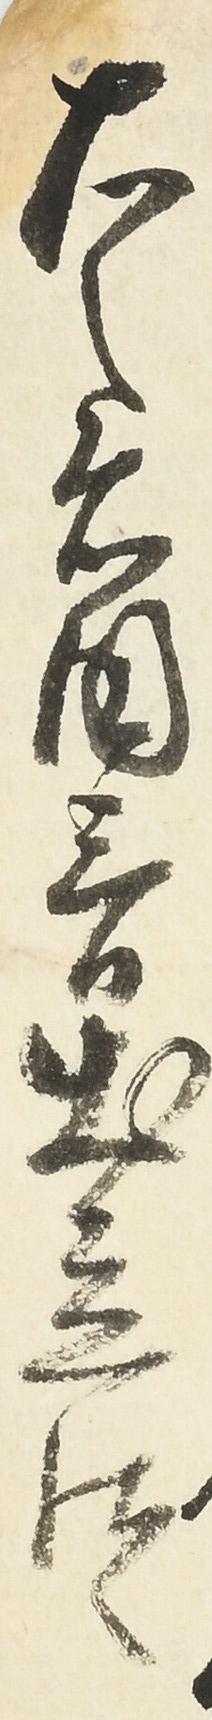右之者同三日出立仕候

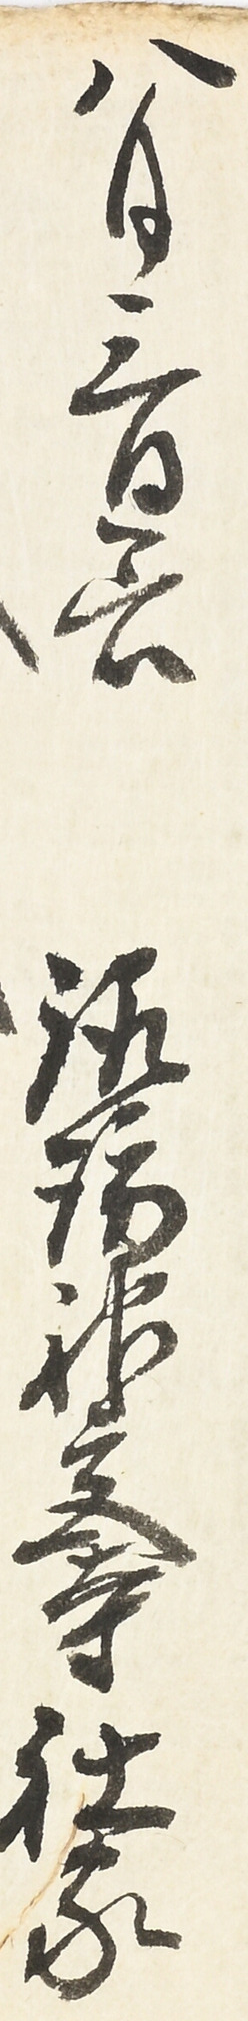八月三日着諏訪神宮寺社家
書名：町中旅人泊控帳
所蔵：伊那市立高遠町図書館・合同会社AMANE
